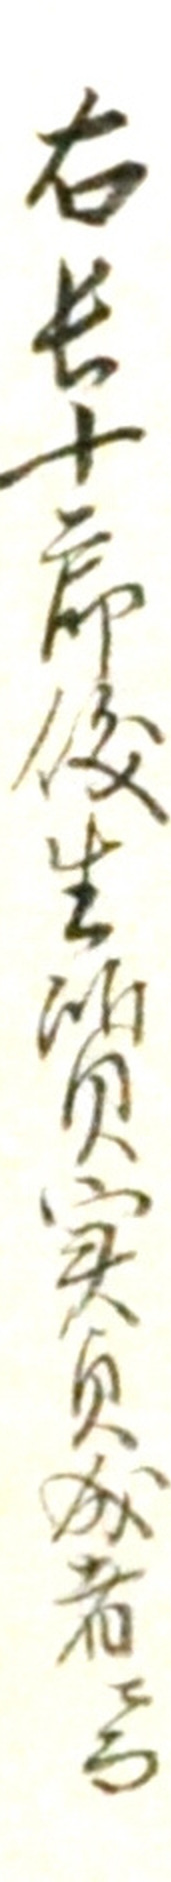右長十郎儀生質実貞成者ニ而
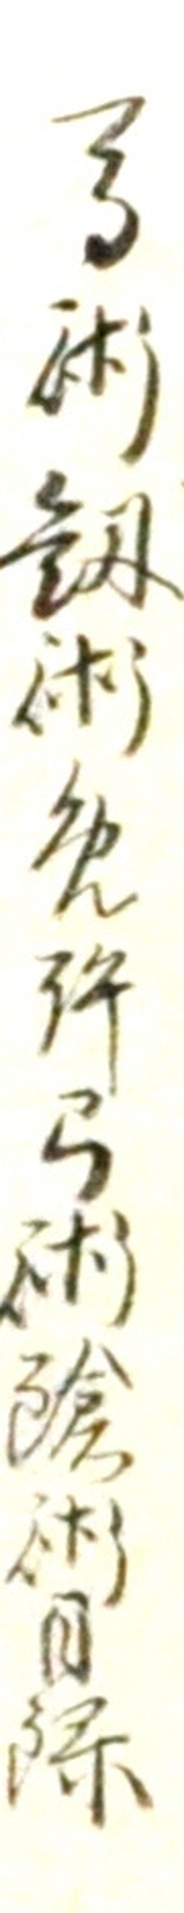馬術剣術免許弓術鎗術目録
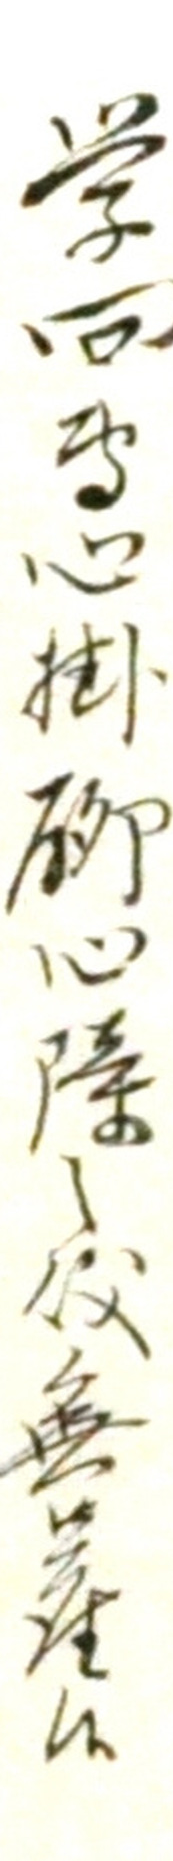学問専心掛聊心障之儀無御座候
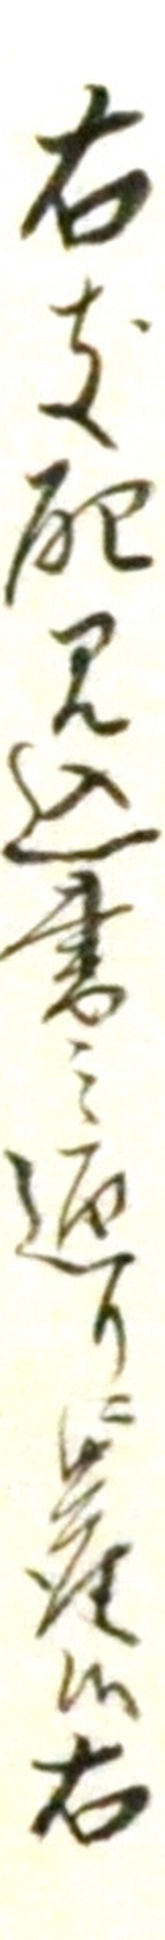右支配見込書之通りに御座候右
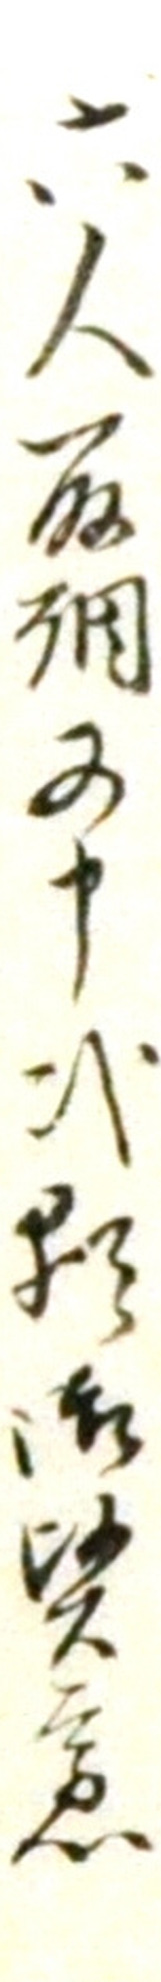六人取調可申哉猶御賢慮
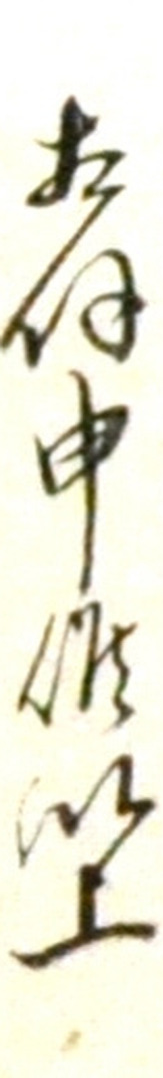相伺申候以上
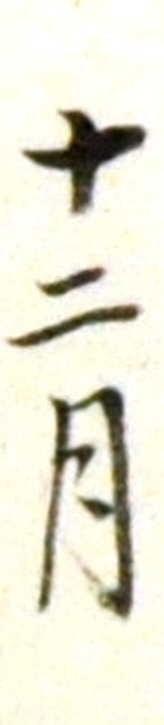十二月
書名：右大将様御書院番御入人調〔一括〕
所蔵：伊那市立高遠町図書館・合同会社AMANE
